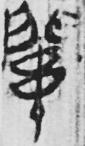○（關）
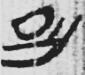疋（雎）
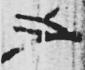之
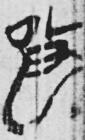改
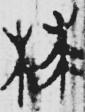梂（樛）
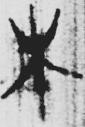木
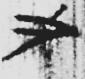之
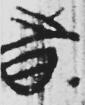○（時）
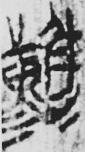灘（漢）
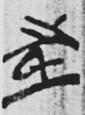○（廣）
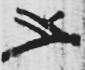之
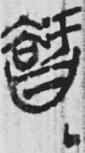智（知）
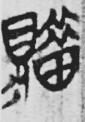鵲
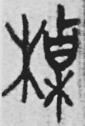樔（巢）
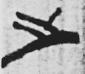之
